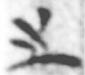之
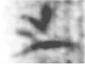之
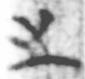之
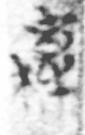○（櫝）
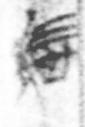騏
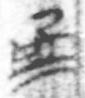爲
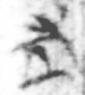○（右）
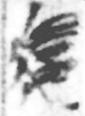驂
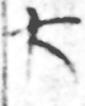大
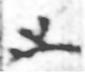之
